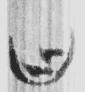曰
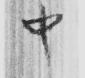中
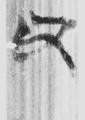父
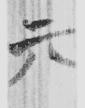亓
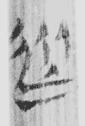從
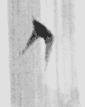人
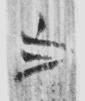之
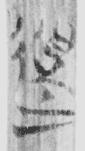道
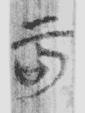可
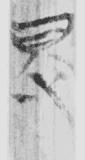𠭁
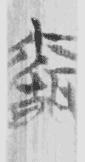{尒䎽}
